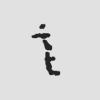言
